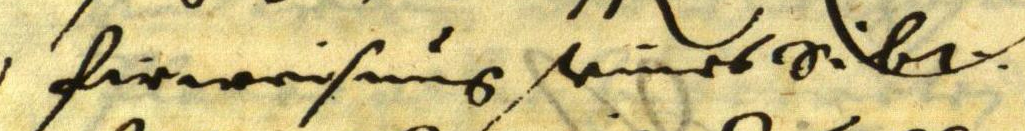firweisūng seines Sibt¬
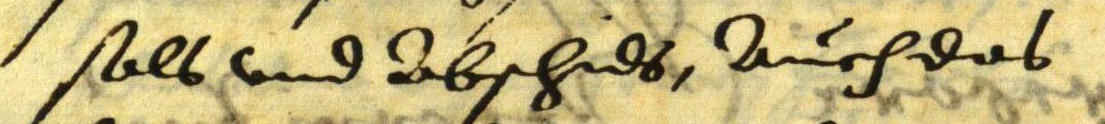sals vnd Abschids, Aūch das
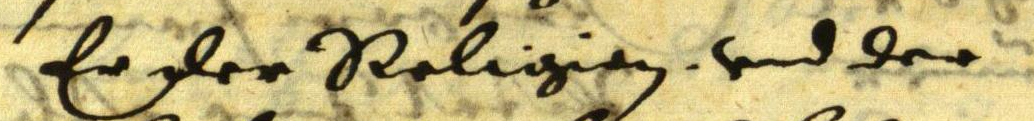Er der Religion. vnd der
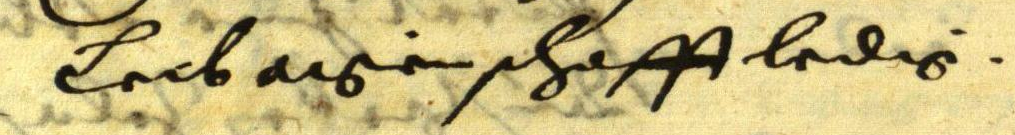Leibaigenschafft ledig.
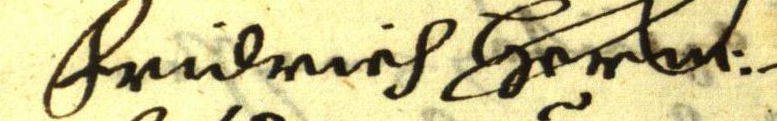Fridrich Herm¬
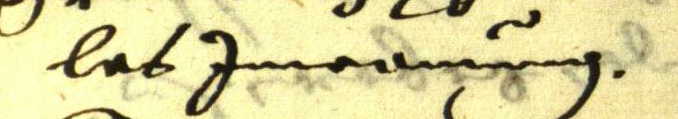les Inwonūng.
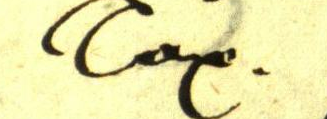Tax.
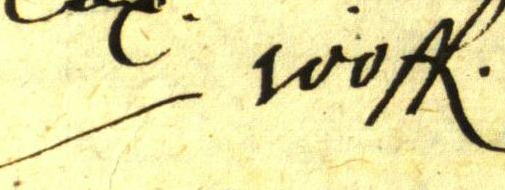— 100 fl.
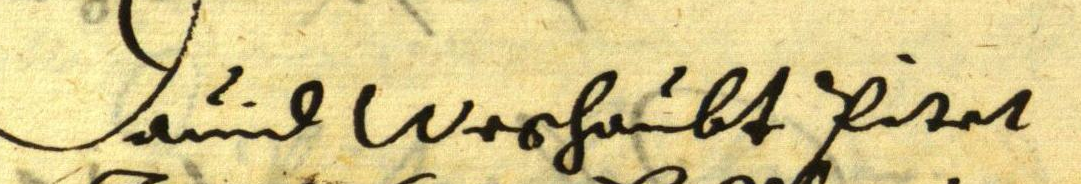Daūid Weghaūbt Pitet
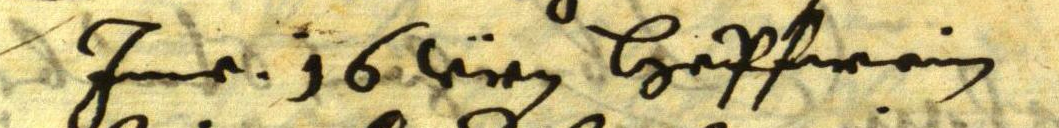Ime. 16 v̈rn HePfwein
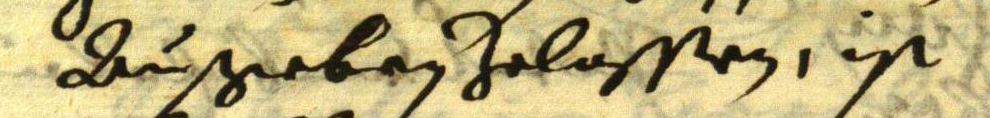Aūsgeben Zelassen, ist
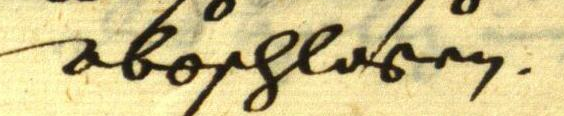Abgschlagen.
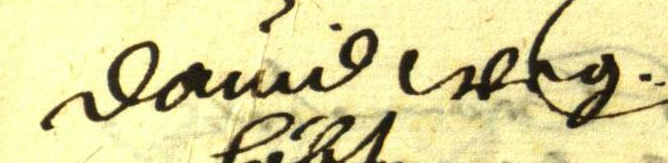Daūid Weg¬
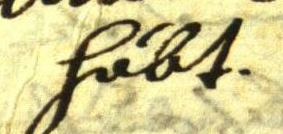hābt.
